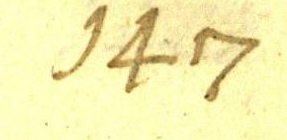147
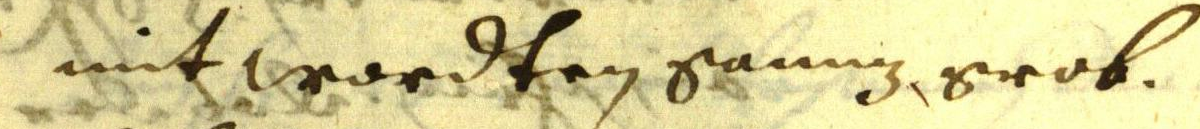mit wordten gannz grob.
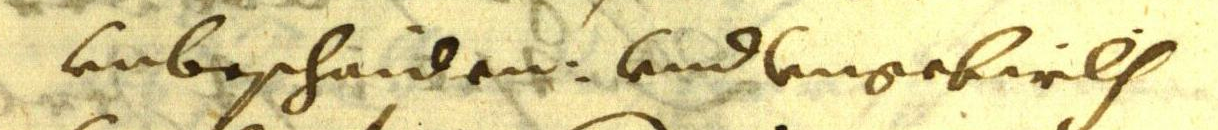vnbeschaiden: vnd vngebirlich
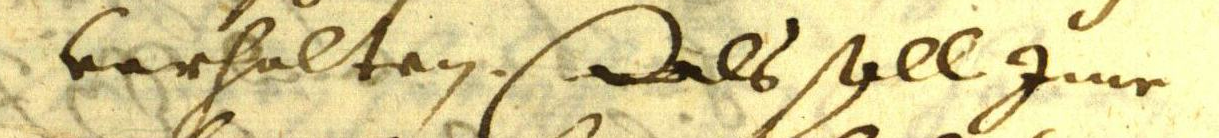verhalten. Als soll Ime
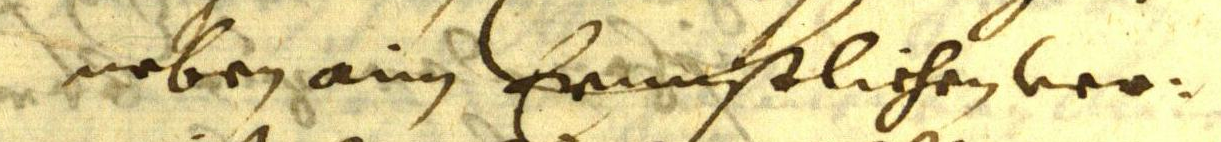neben aim Ernnstlichen ver¬
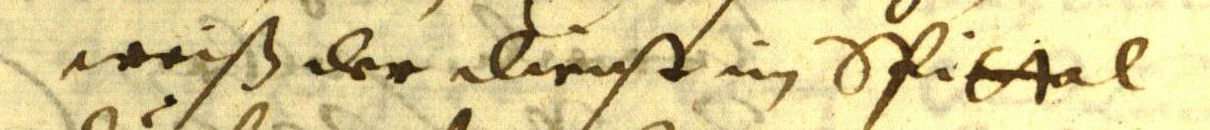weiß der dienst im Spittal
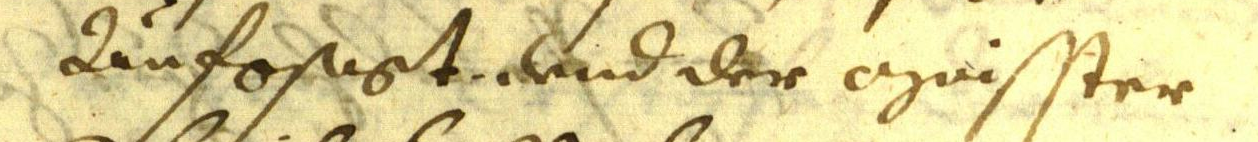Aūfgsagt. vnd der Maisster
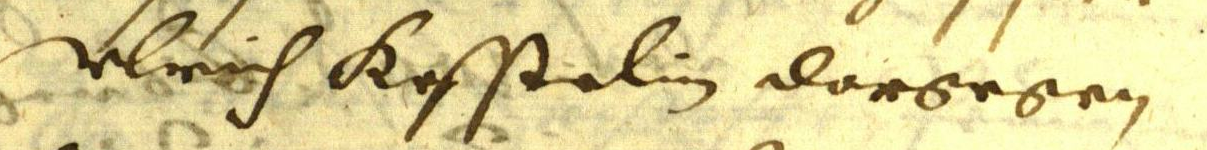Vlrich Kesstelin dargegen
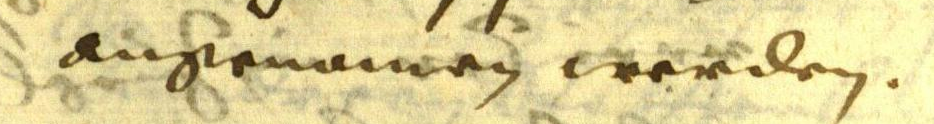angenommen werden.
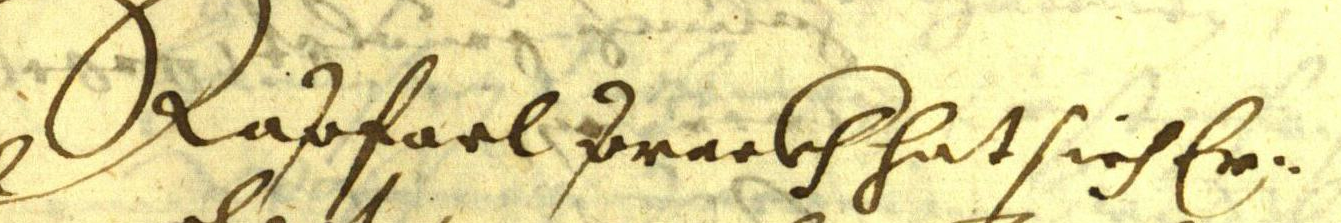Rapfael Prackh hat sich Er¬
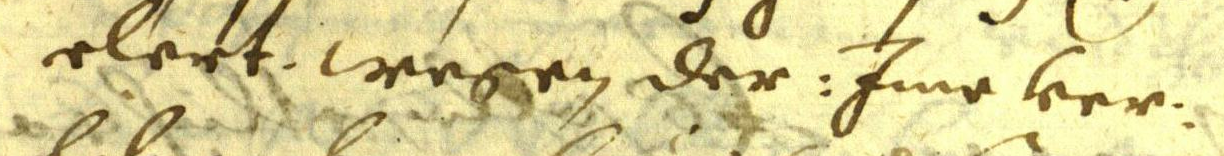clert. wegen der: Ime ver¬
